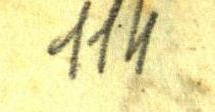114
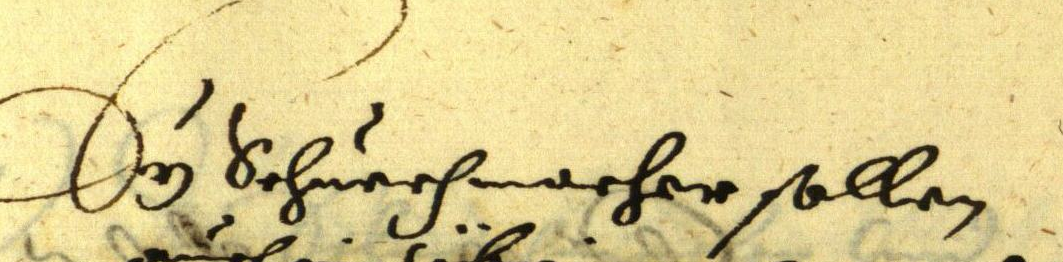Sȳ Schūechmacher sollen
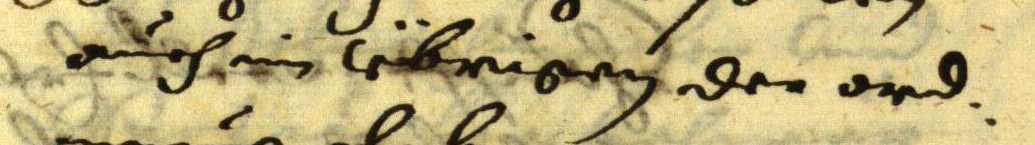aūch im v̈brigen der ord¬
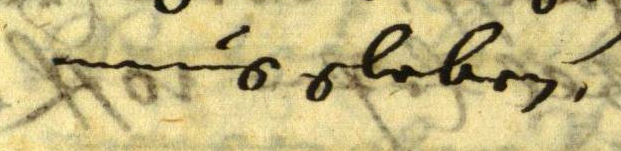nūng gleben.
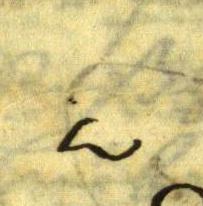t
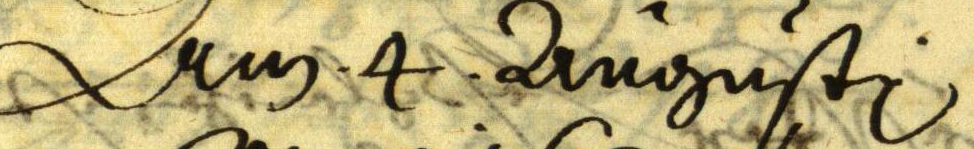Am .4. Aūgūstj
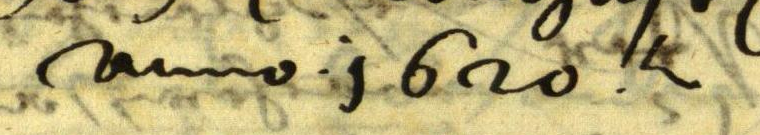Anno .1620.t
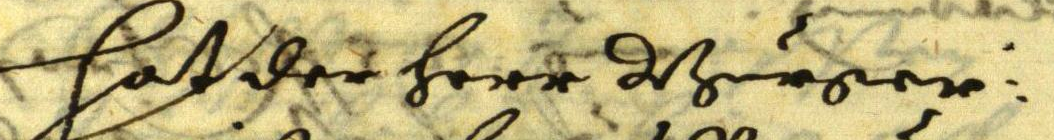hat der herr Būrger¬
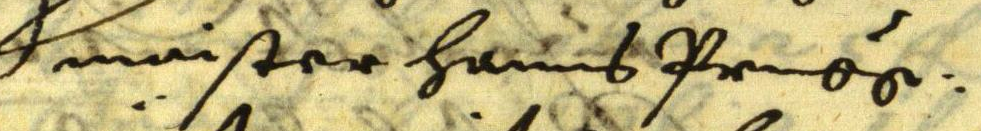maister Hanns Prūgg¬
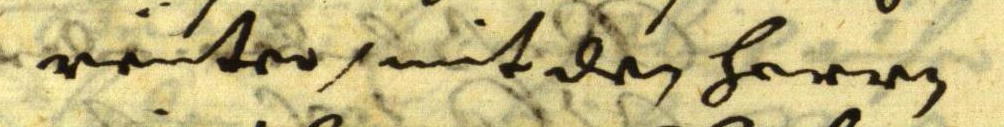reüter mit den herrn
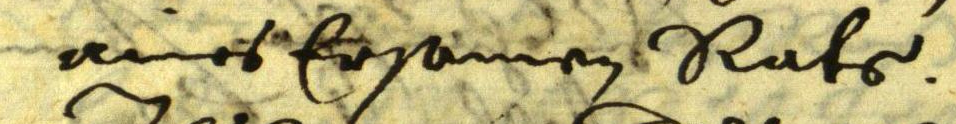aines Ersamen Rats.
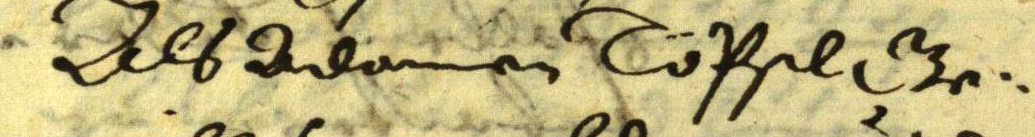Als Adamen TöPsl Ge¬
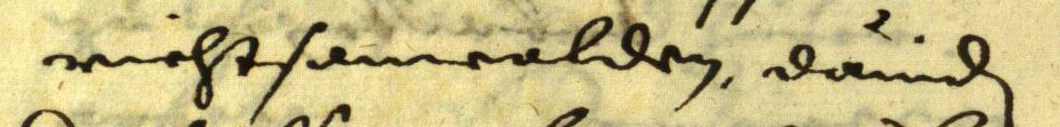richtsanwalden, Daūiden
